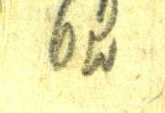62
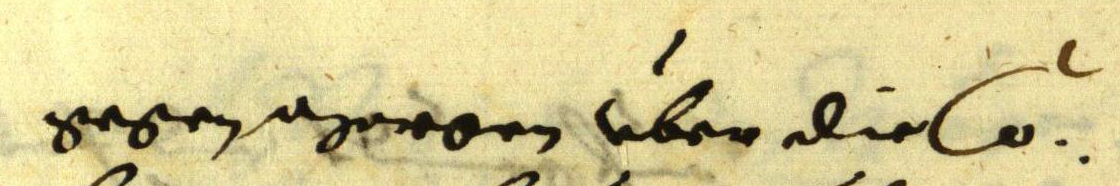gegen Morgen v̄ber die Co¬
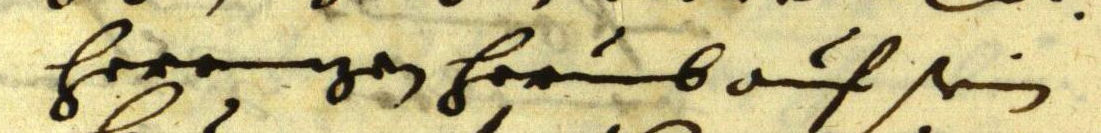herenntzen herūmb aūf sein
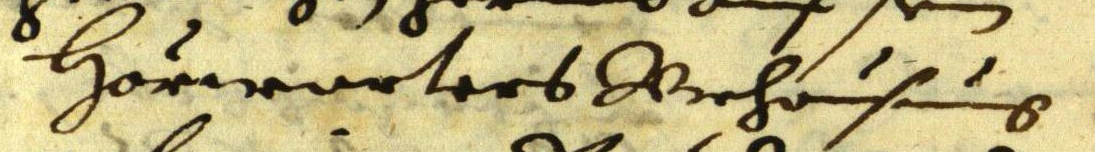Hōrwarters Behaūsūng
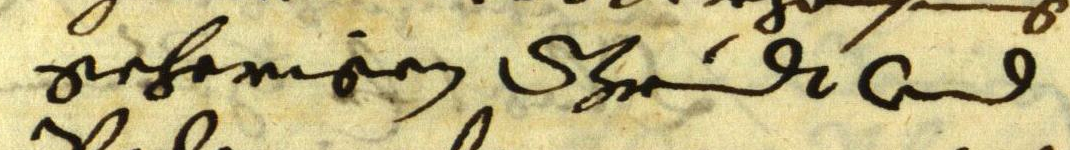geherigen Grūndt vnd
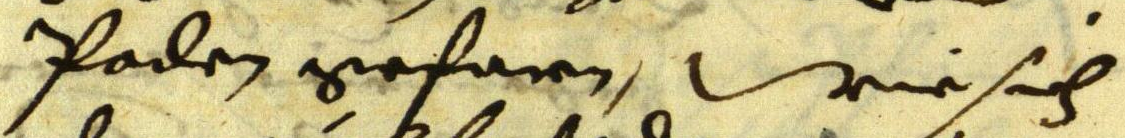Poden gefarn, Wie sich
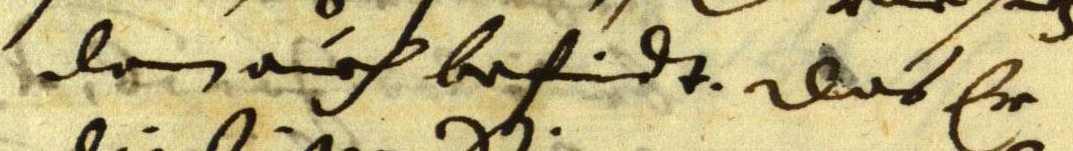dann aūch befindt. das Er
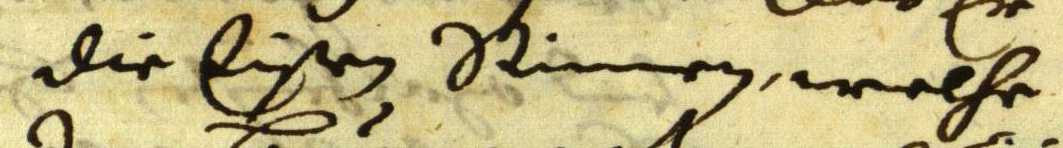die Eisen Rinnen, welche
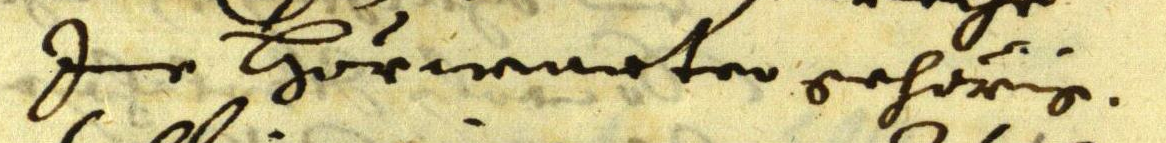Ime Hōrwarter gehōrig.
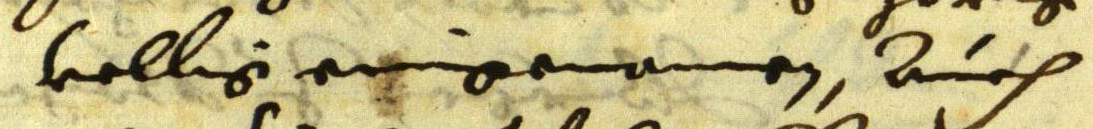vellig eingenommen, Aūch
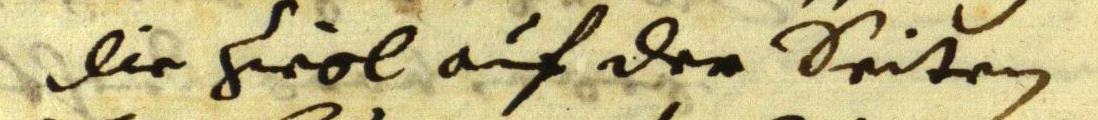die Ziegl aūf der Seiten
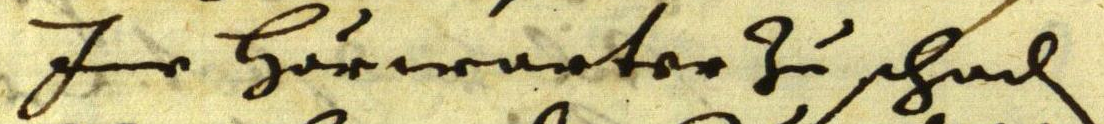Ime Hōrwarter Zū schad
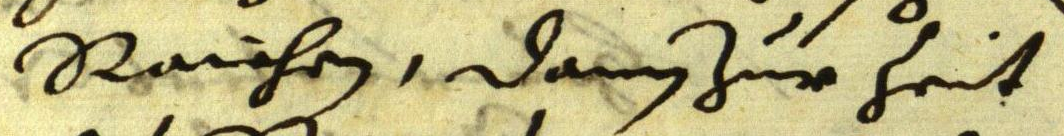Raichen, dann Zūr Zeit
